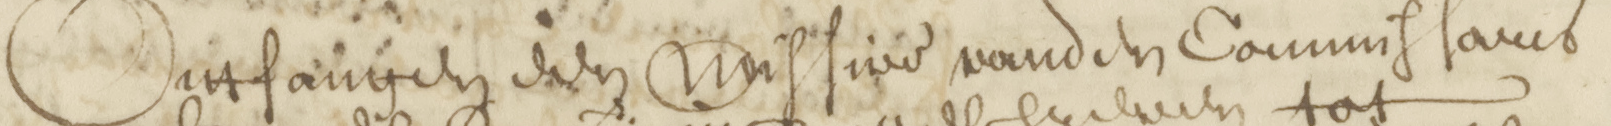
Ontfangen een Missive vanden Commissaris
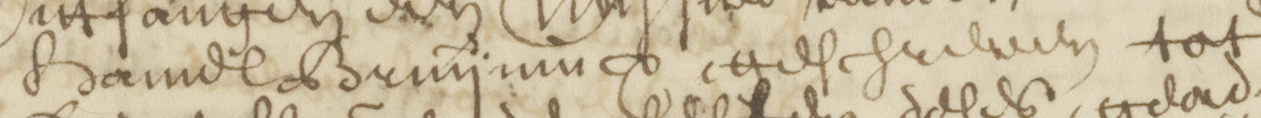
Hamel Bruijnincx, geschreven tot
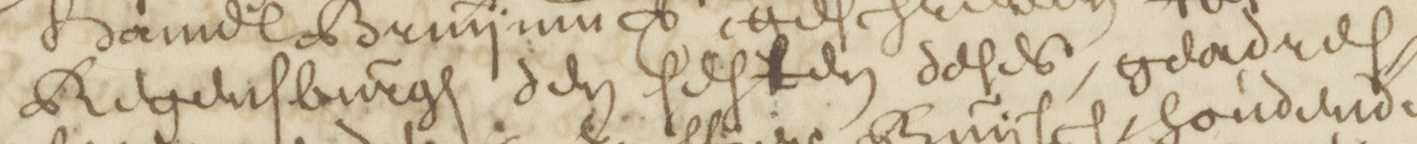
Regensburgh den sesten deses, geadres„
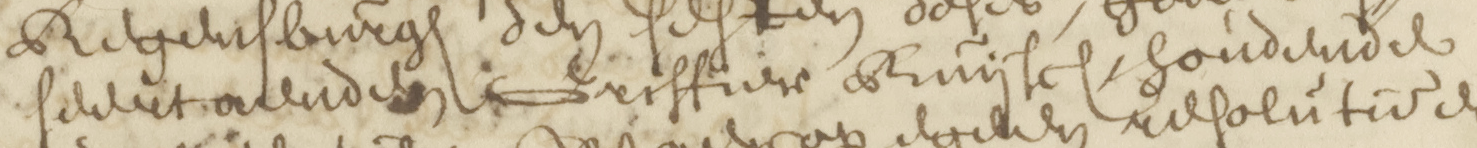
seert aenden Griffier Ruijsch, houdende
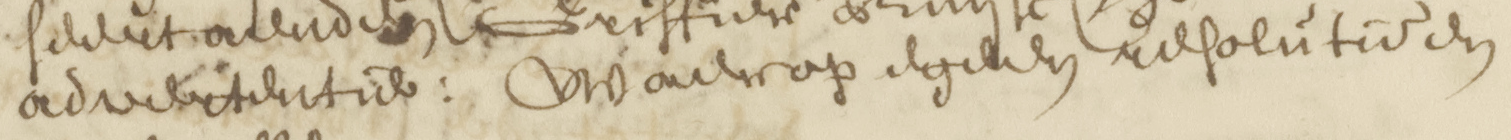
advertentie: Waerop egeen resolutie en
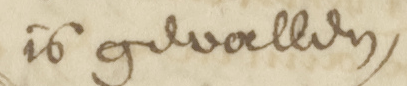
is gevallen.
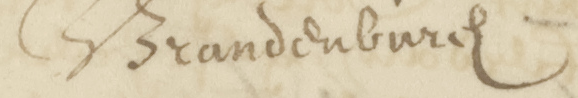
Brandenburch
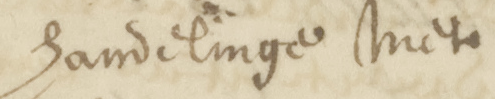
handelinge met
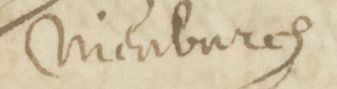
nieuburch
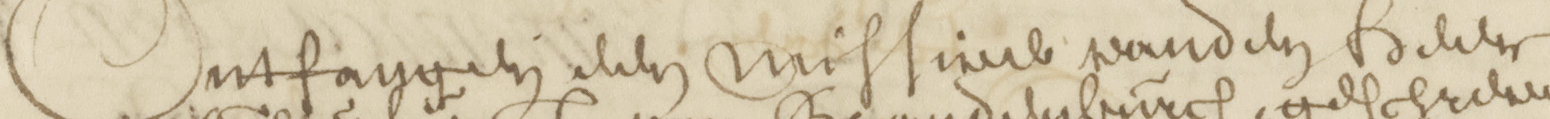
Ontfangen een Missive vanden Heer
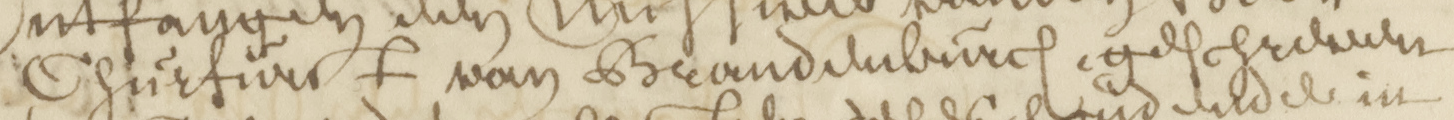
Churfurst van Brandenburch, geschreven
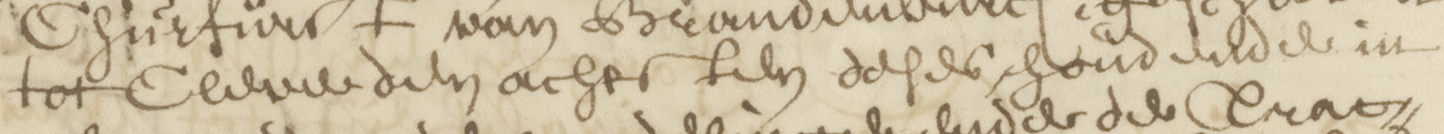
tot Cleve den achtsten deses, houdende in
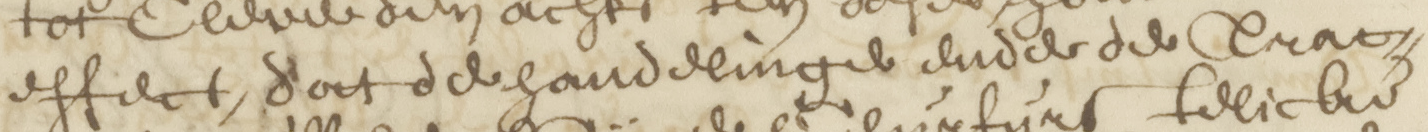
effect, dat de handelinge ende de Trac,
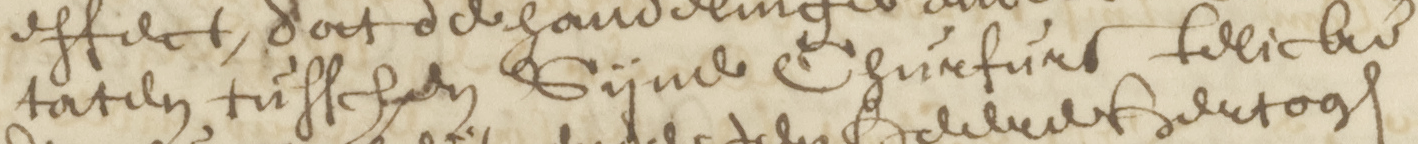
taten tusschen Sijne Churfurstelicke
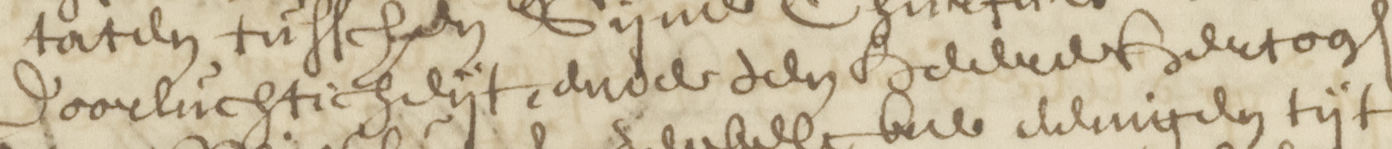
Doorluchticheijt, ende den Heere Hertogh
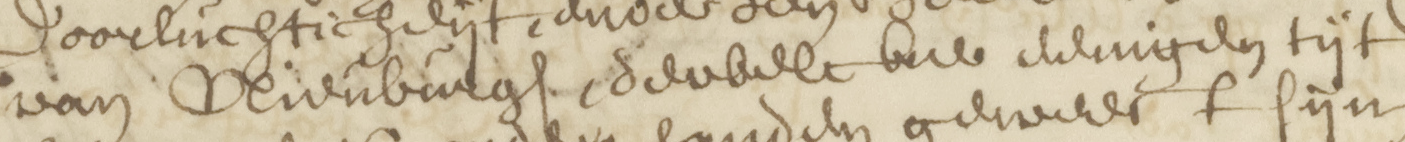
van Nlieuburgh, dewelcke eenigen tijt
